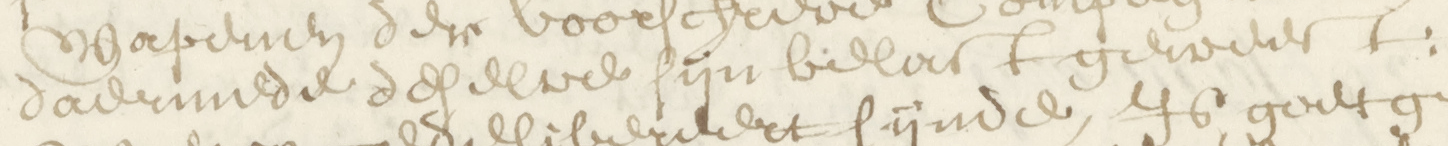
daermede deselve sijn belast geweest:
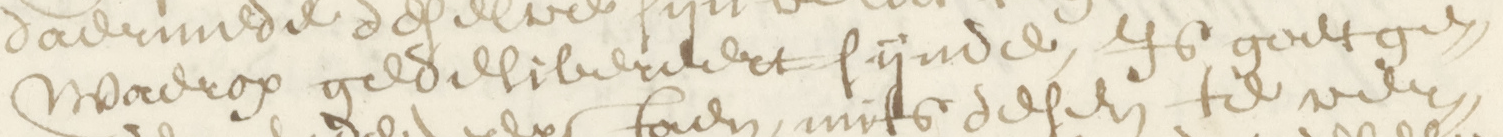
Waerop gedelibereert sijnde, Is goetge„
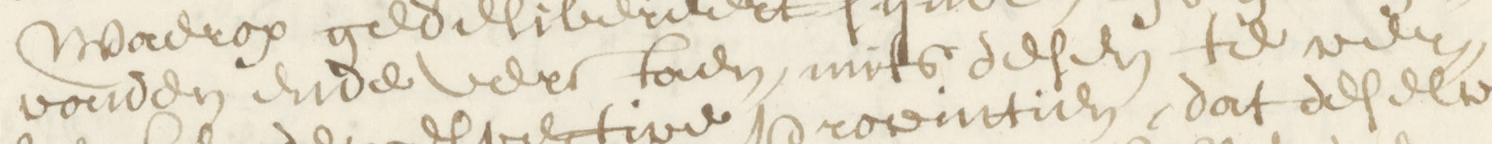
vonden ende verstaen, mits desen te ver„
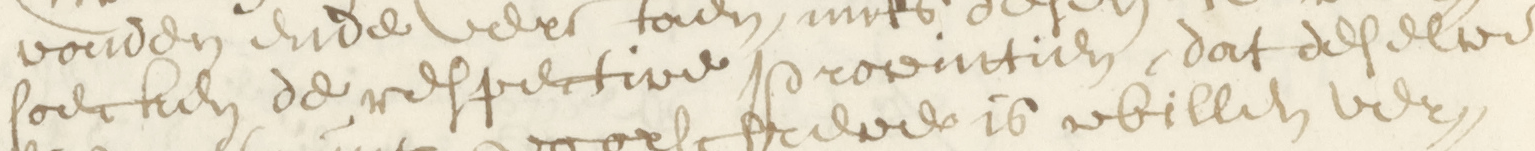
soecken de respective provintien, dat deselve
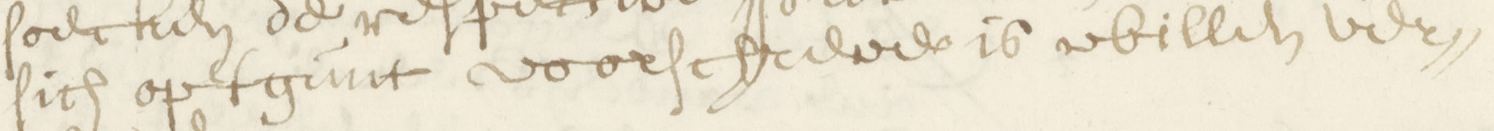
sich op tgunt voorschreven is willen ver„
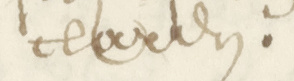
claren.
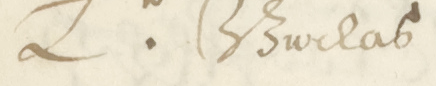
Lt Burlas
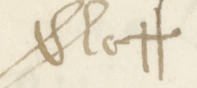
vloff
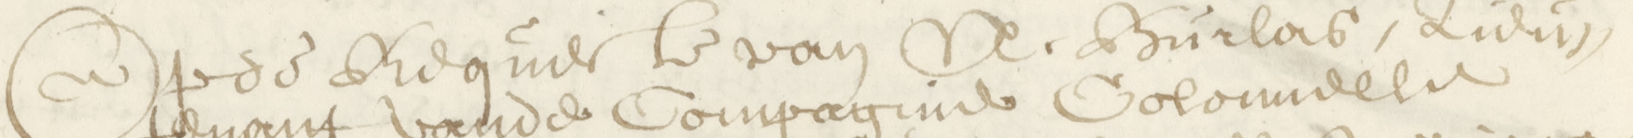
Opde Requeste van N. Burlas, Lieu„
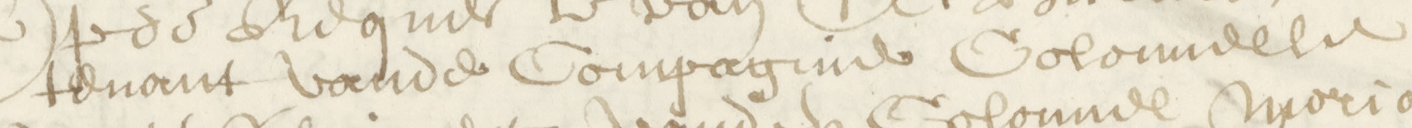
tenant vande Compagnie Colonnelle
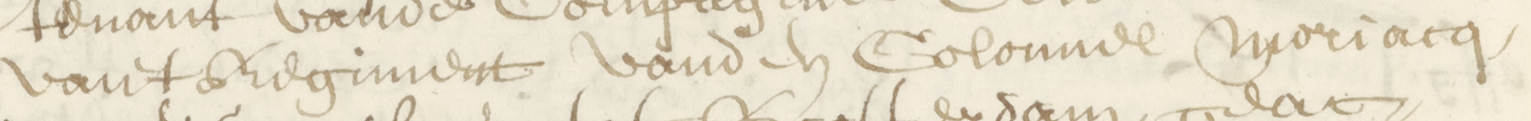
vant Regiment vanden Colonnel Moriacq,
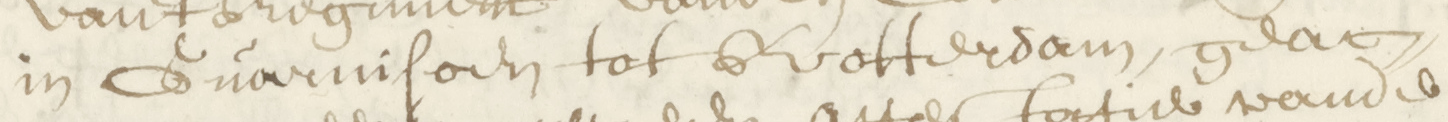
in Guarnisoen tot Rotterdam, geac„
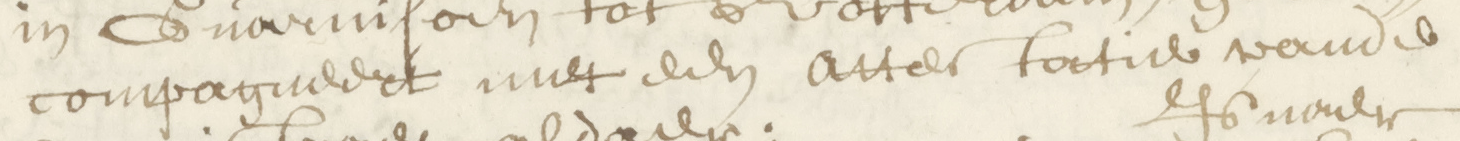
compagneert met een Attestatie vande
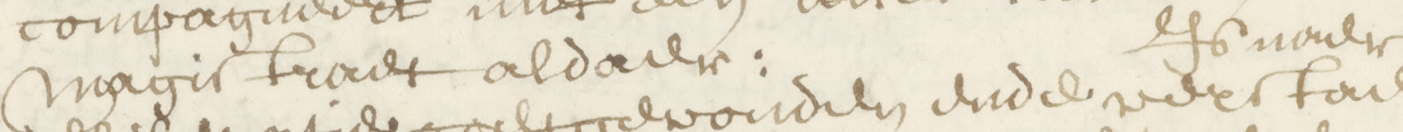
Magistraet aldaer: Is naer
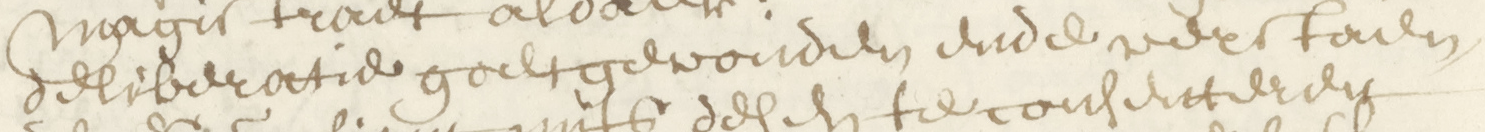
deliberatie goetgevonden ende verstaen,
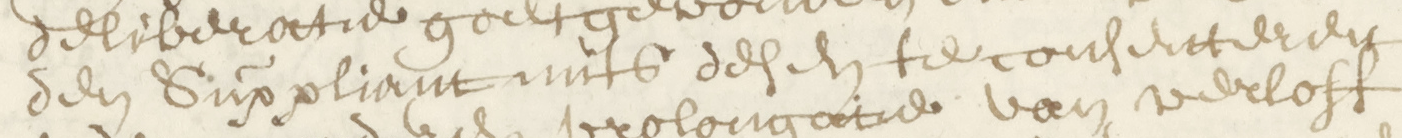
den Suppliant mits desen te consenteren,
